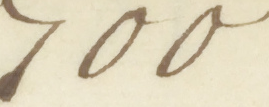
700
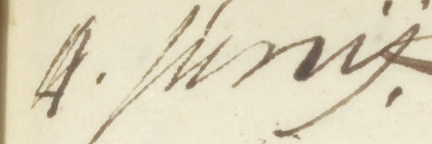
4. junij.
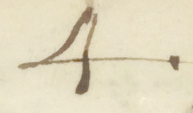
4.
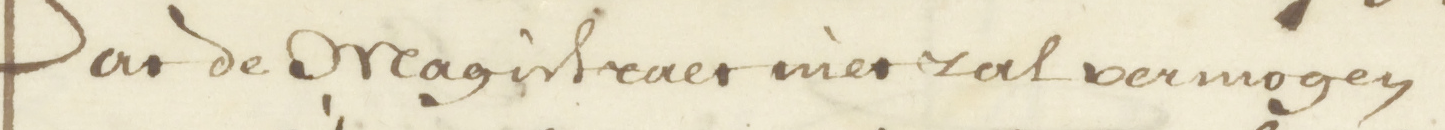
Dat de Magistraet niet zal vermogen
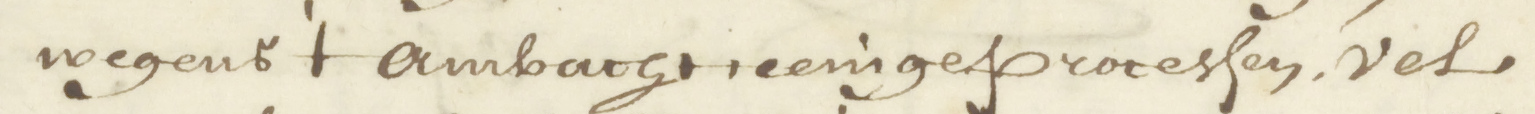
wegens ‛t Ambacht, eenige processen vel
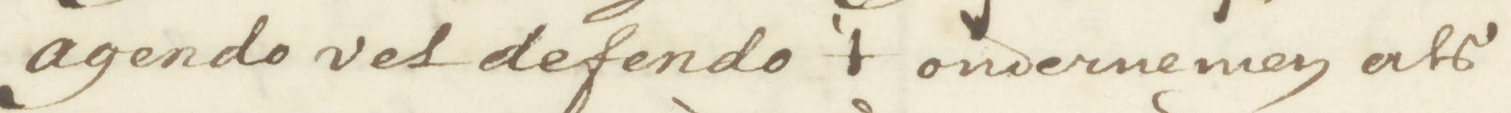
agendo vel defendo ‛t ondernemen als
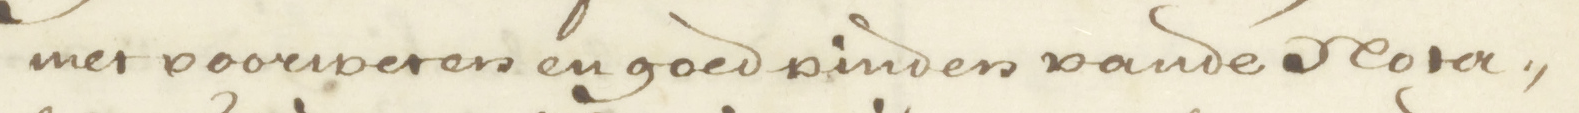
met voorweten en goedvinden vande Nota„
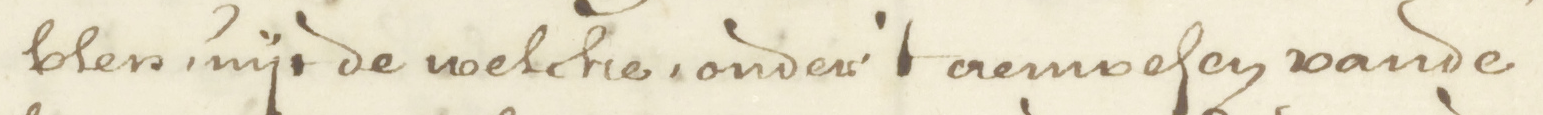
blen uijt de welcke, onder ‛t aenwesen vande
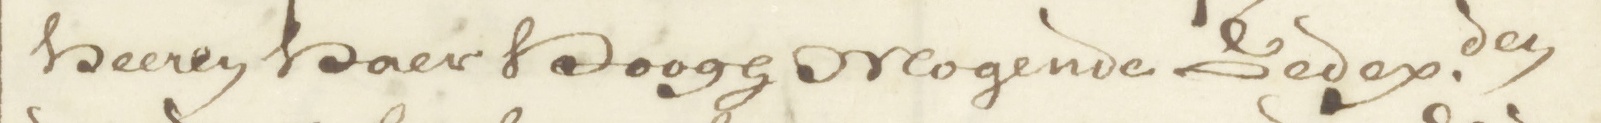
Heeren Haer Hoogh Mogende Gedep.den.
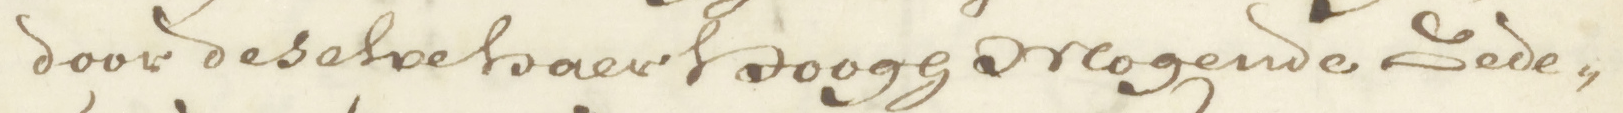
door deselve haer Hoogh Mogende Gede„
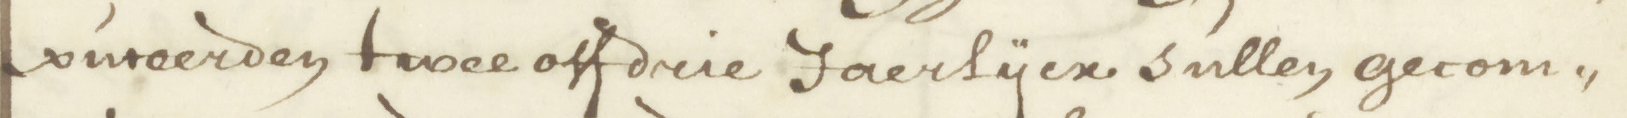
teerden twee off drie Jaerlijcx sullen gecom„
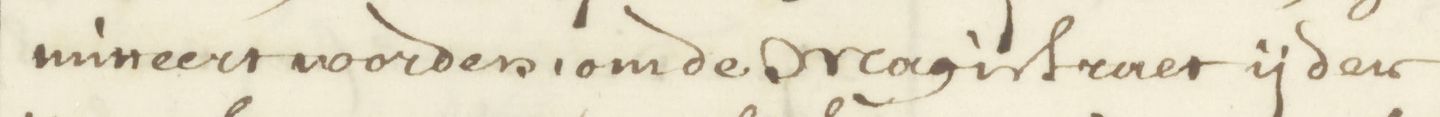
mitteert worden, om de Magistraet ijder
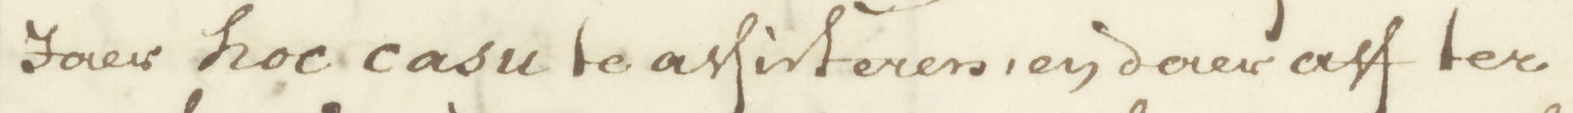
Jaer hoc casu te assisteren, en daer aff ter
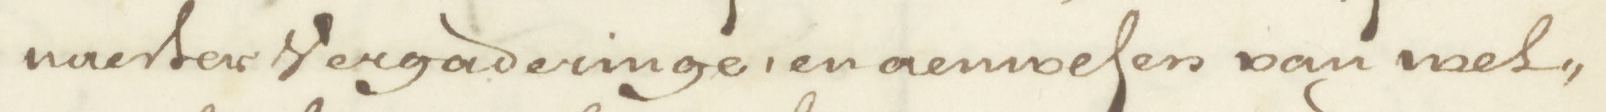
naester Vergaderinge, en aenwesen van wel„
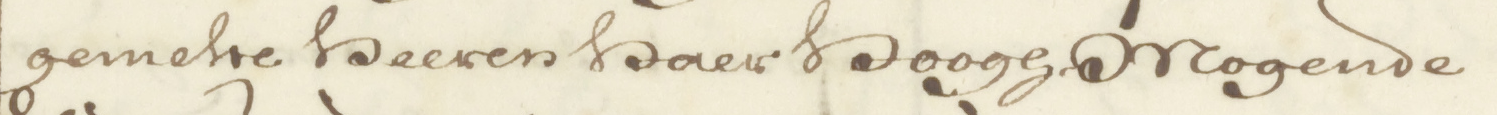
gemelte Heeren Haer Hoogh Mogende
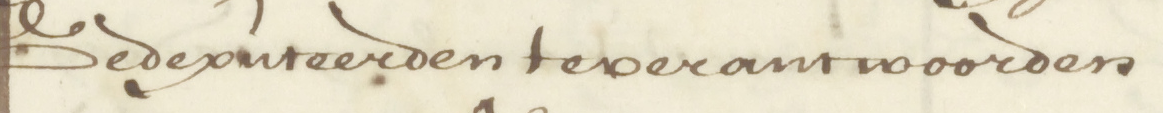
Gedeputeerden te verantwoorden.
